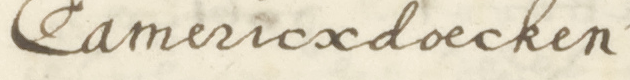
Camericxdoecken
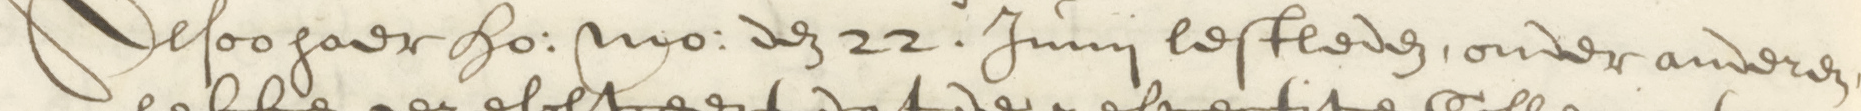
Alsoo haer Ho:Mo: den 22e. Junij lestleden, onder anderen
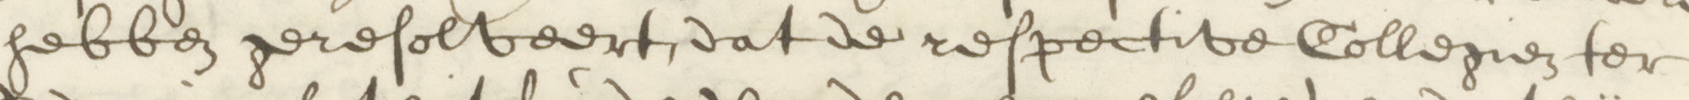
hebben geresolveert, dat de respective Collegien ter
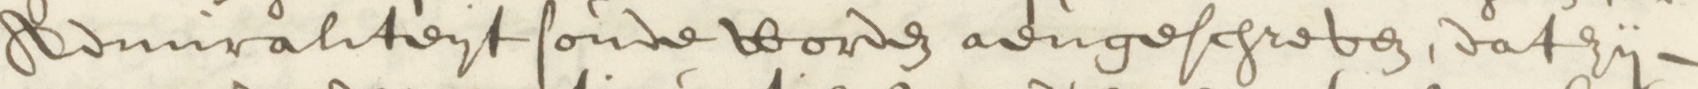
Admiraliteijt soude worden aengeschreven, dat zij
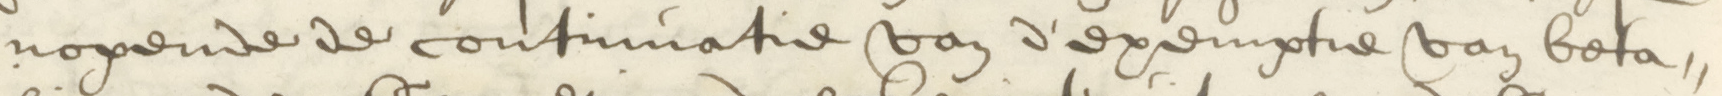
nopende de continuatie van d'exemptie van beta„
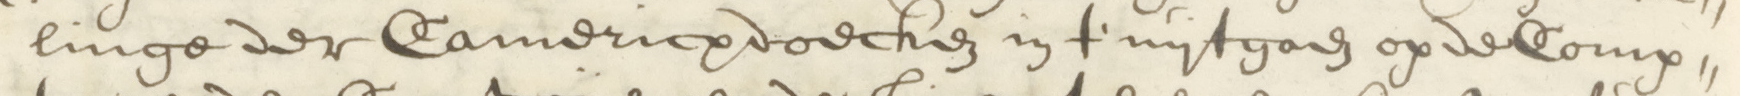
linge der Camericxdoecken in t‛uijtgaen op de Comp„
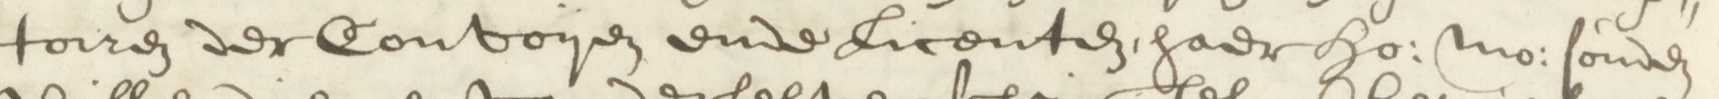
toiren der Convoijen ende Licenten, haer Ho:Mo: souden
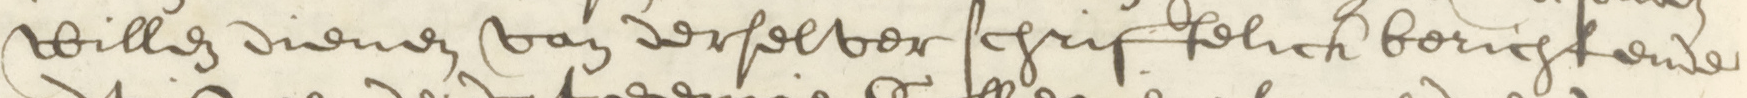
willen dienen van derselver schriftelick bericht ende
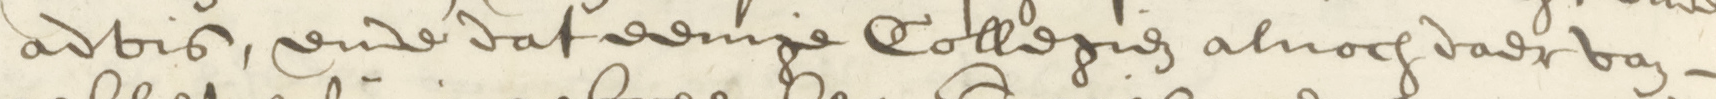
advis, ende dat eenige Collegien alnoch daer van
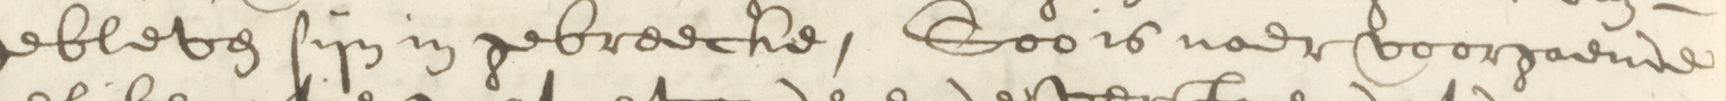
gebleven sijn in gebreecke, Soo is naer voorgaende
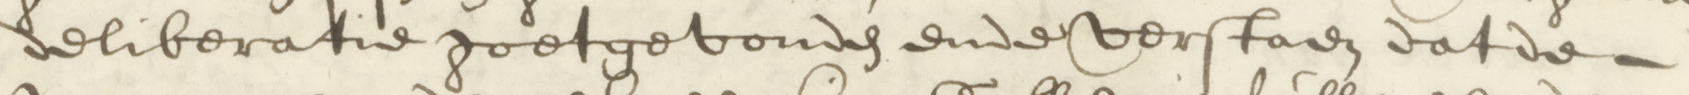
deliberatie goetgevonden ende verstaen dat de —
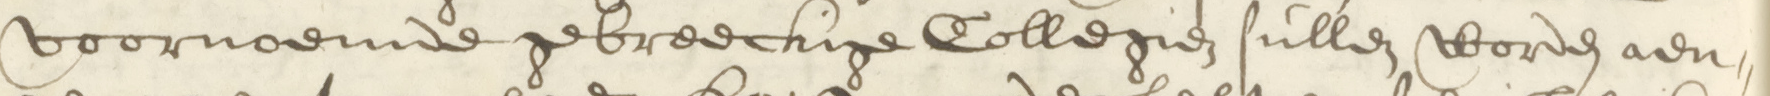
voornoemde gebreeckige Collegien sullen worden aen„
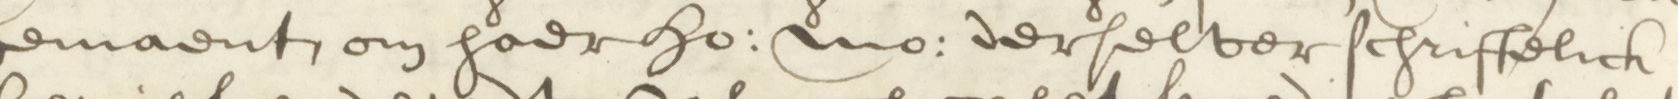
gemaent, om haer Ho:Mo: derselver schriftelick
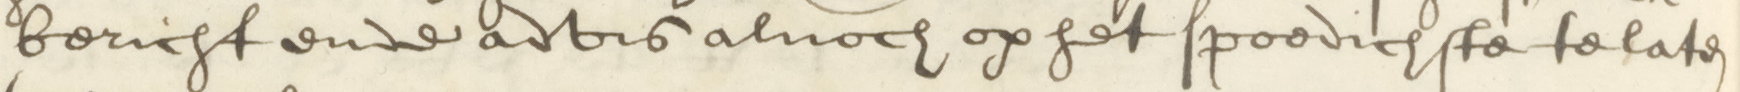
bericht ende advis alnoch op het spoedichste te laten
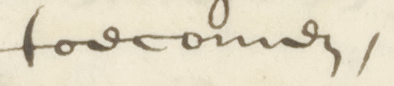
toecomen.
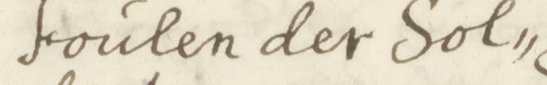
Foulen der Sol„
